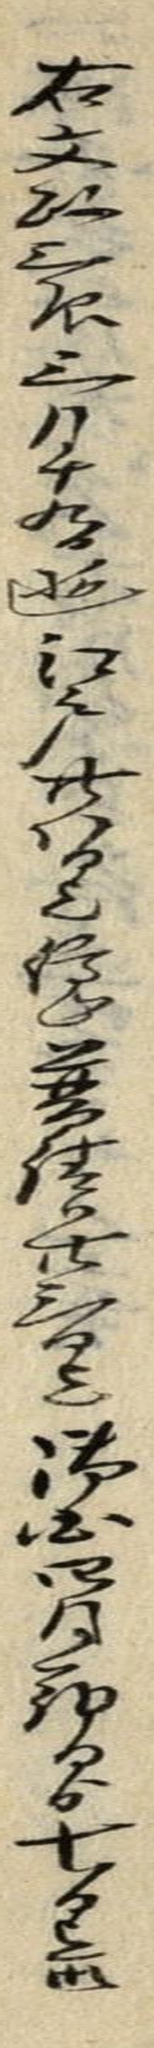右文政三辰三月十九日逝江戸廿八日迄停止普請は廿三日迄御国四月朔日ゟ七日迄御
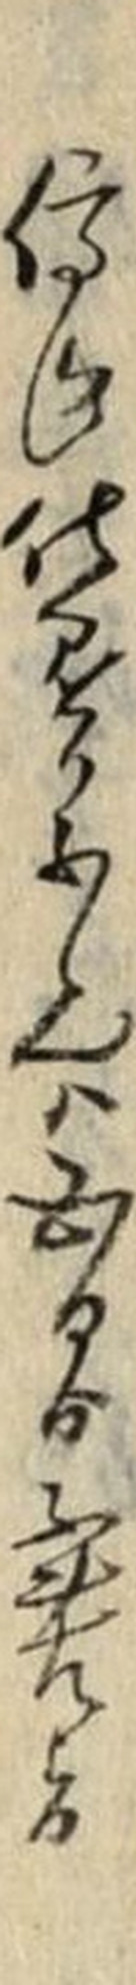停止仕懸りふしんは五日ゟ不苦旨
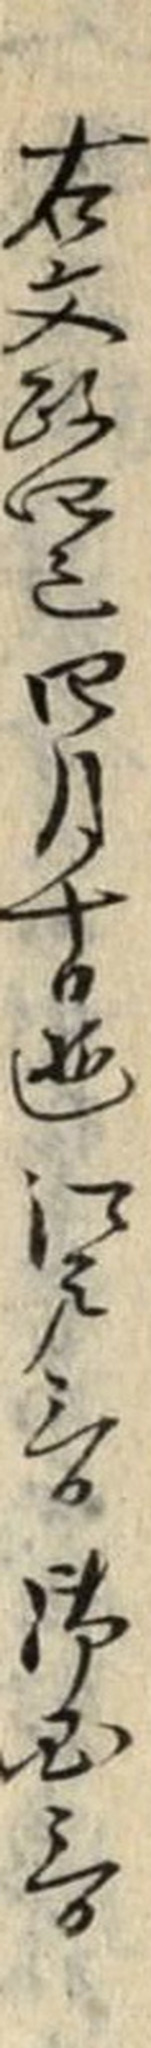右文政四巳四月十日逝江戸三日御国三日
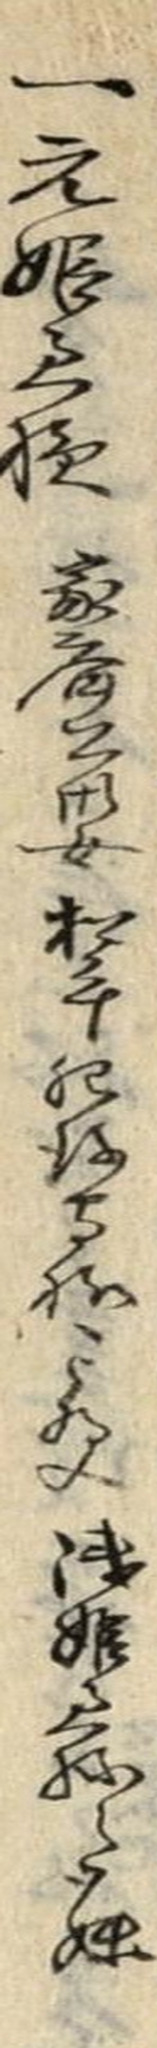一元姫君様家斉公御女松平肥後守様へ被為入浅姫君様之御妹
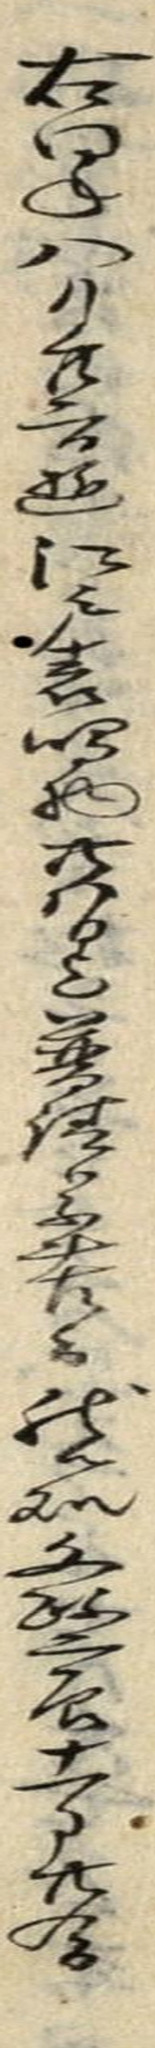右同年八月廿二日逝江戸表鳴物廿八日迄普請は不苦旨然ル処文政二辰十一月廿九日
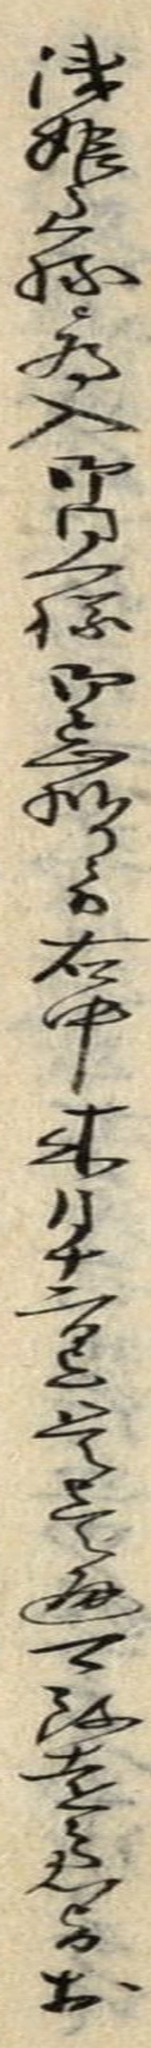浅姫君様被為入御同人様御忌掛りに付右中来月十二日迄是迄之通可致遠慮旨於
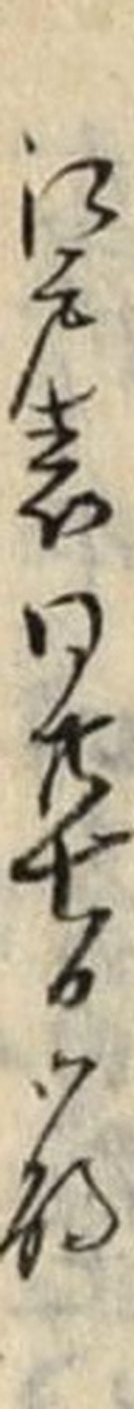江戸表同廿七日御触
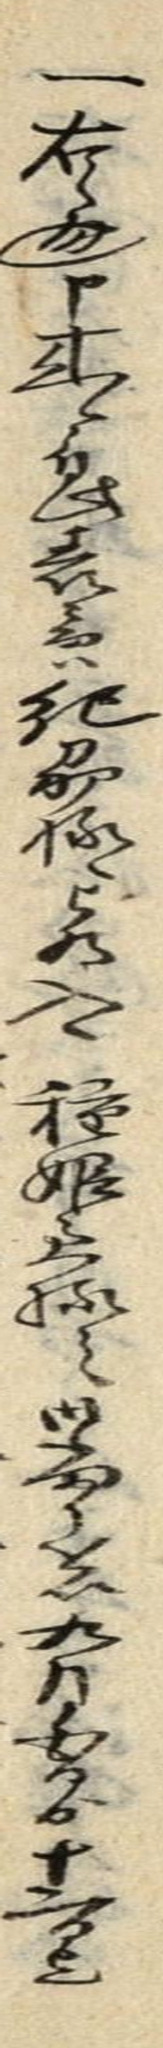一右之通申来候に付此表にては紀州様へ被為入候種姫君様之御当りを以九月五日ゟ十二日迄
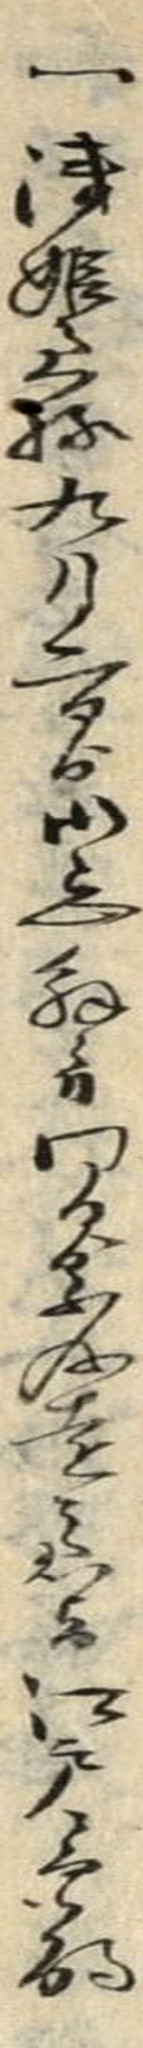一浅姫君様九月二日ゟ御忌解に付同日ゟ不及遠慮旨江戸にて御触

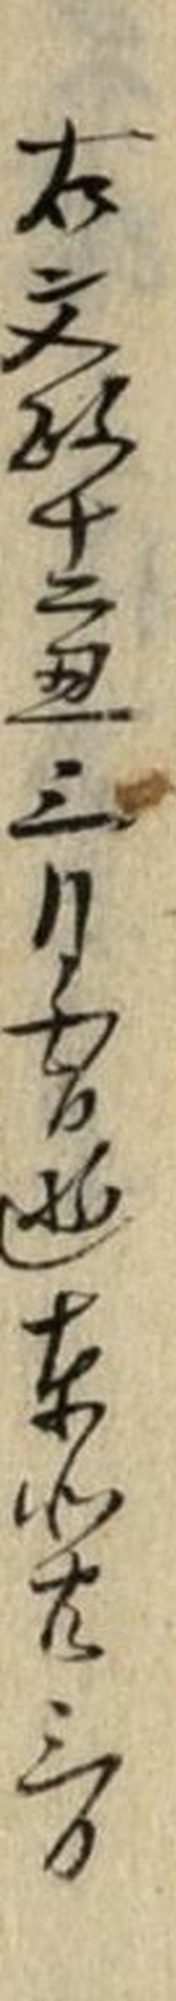右文政十二丑三月五日逝東北共三日
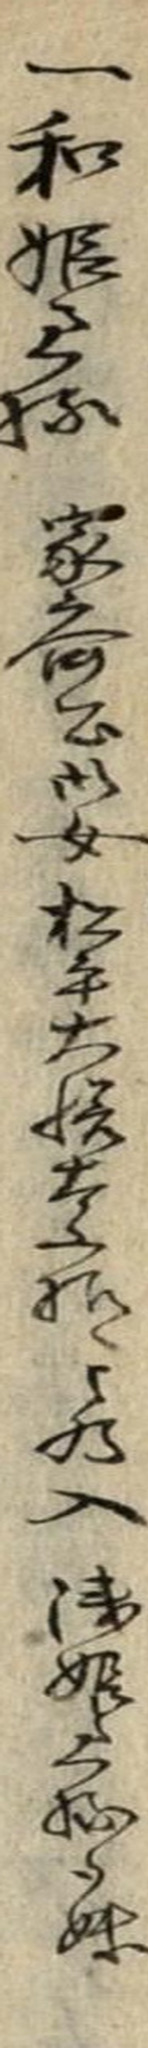一和姫君様家斉公御女松平大膳大夫様へ被為入浅姫君様御妹
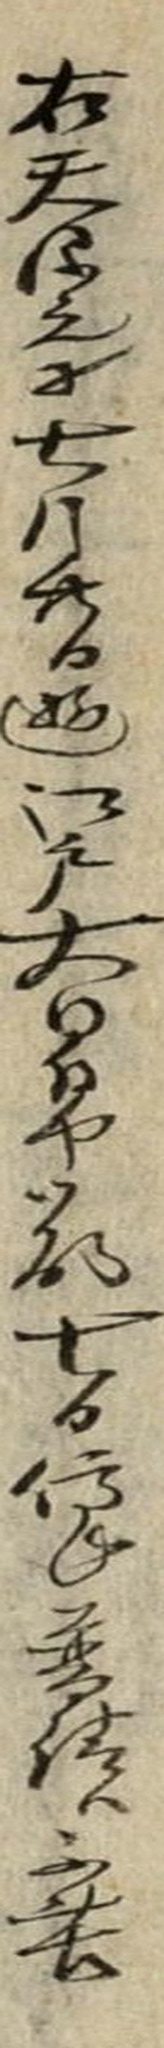右天保元刁七月廿日逝江戸大目付中御触七日停止普請は不苦
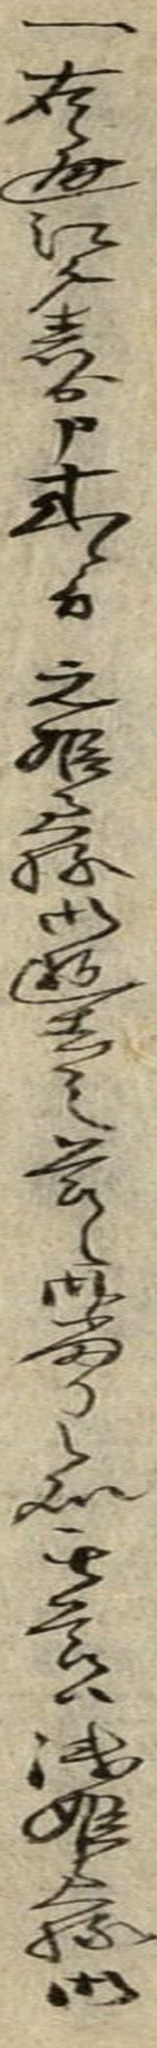一右之通江戸表ゟ申来候付元姫君様御逝去之節之御当り之処其節は浅姫君様御
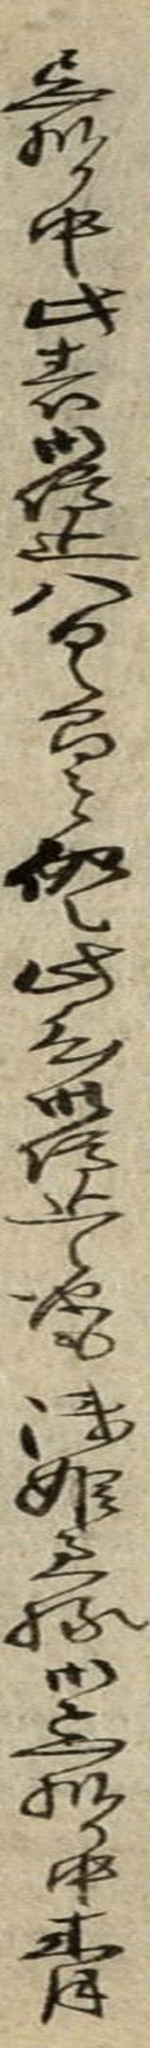忌掛り中此表御停止八日之間に候仍之此度御停止之儀も浅姫君様御忌掛り中来月
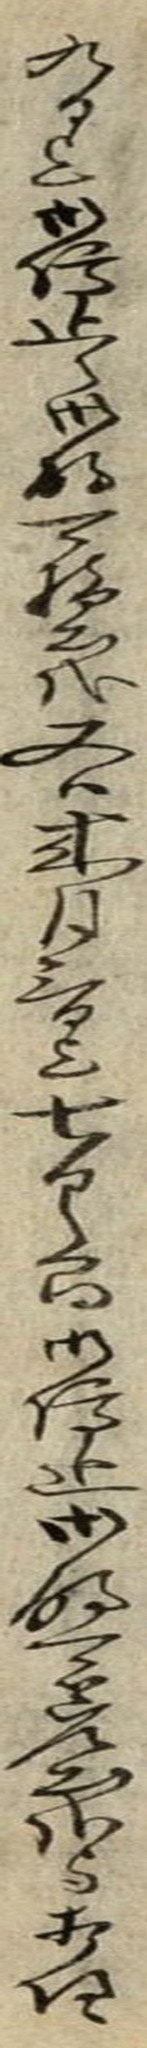九日迄御停止之御触可指出哉又は来月三日迄七日之間御停止御触可差出哉と相伺候
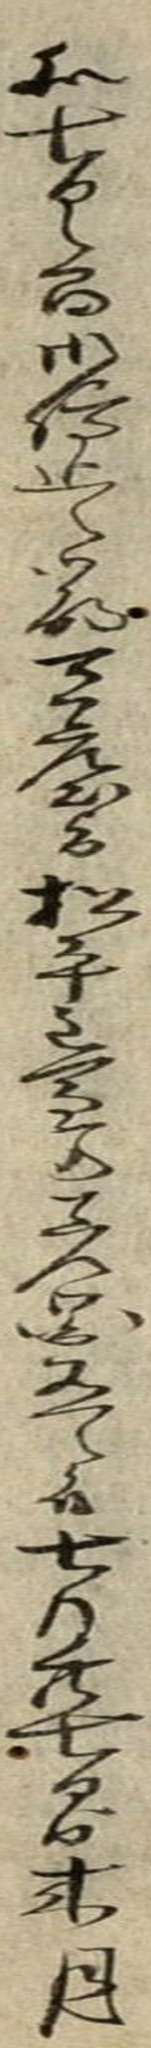処七日之間御停止之御触可差出旨松平主馬方差図有之に付七月廿七日ゟ来月
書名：御停止異変死失
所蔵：福井県文書館 Fukui Prefectural Archives
